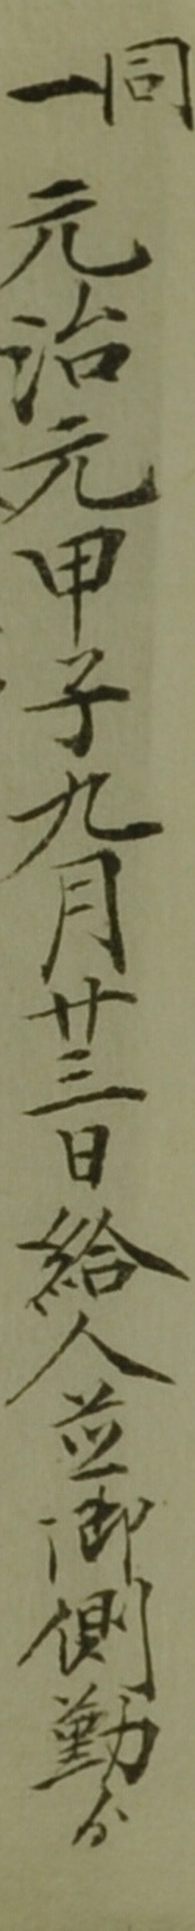一元治元甲子九月廿三日給人並御側勤ゟ
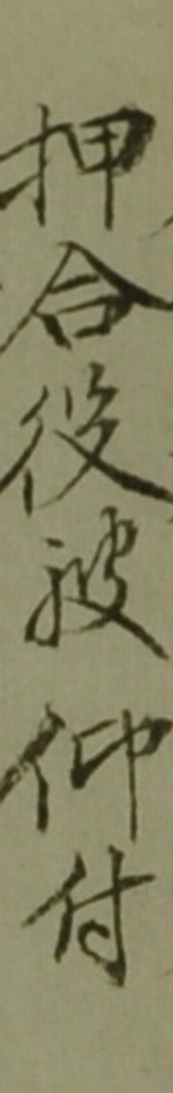押合役被仰付
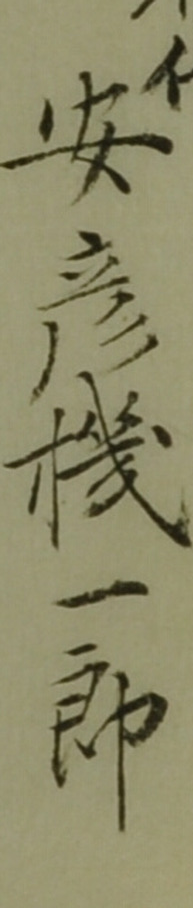安彦機一郎
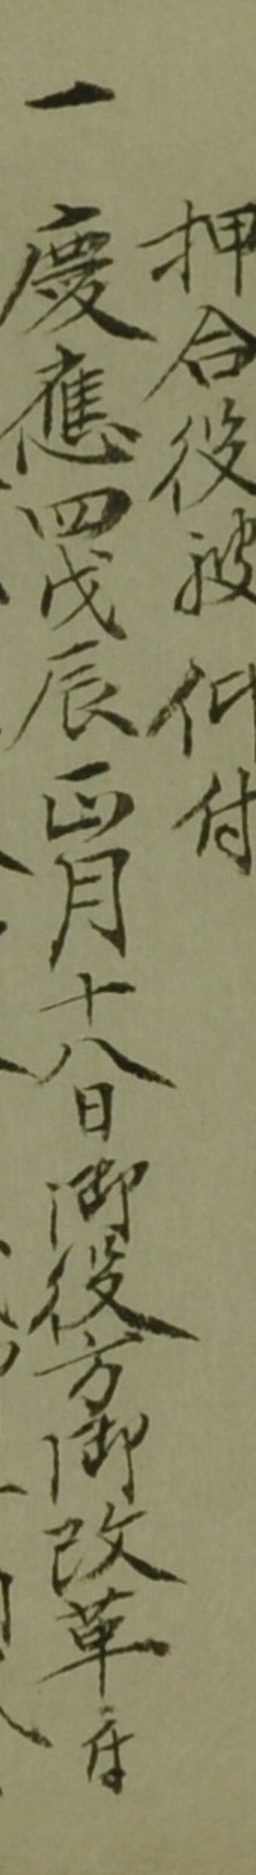一慶応四戊辰正月十八日御役方御改革ニ付
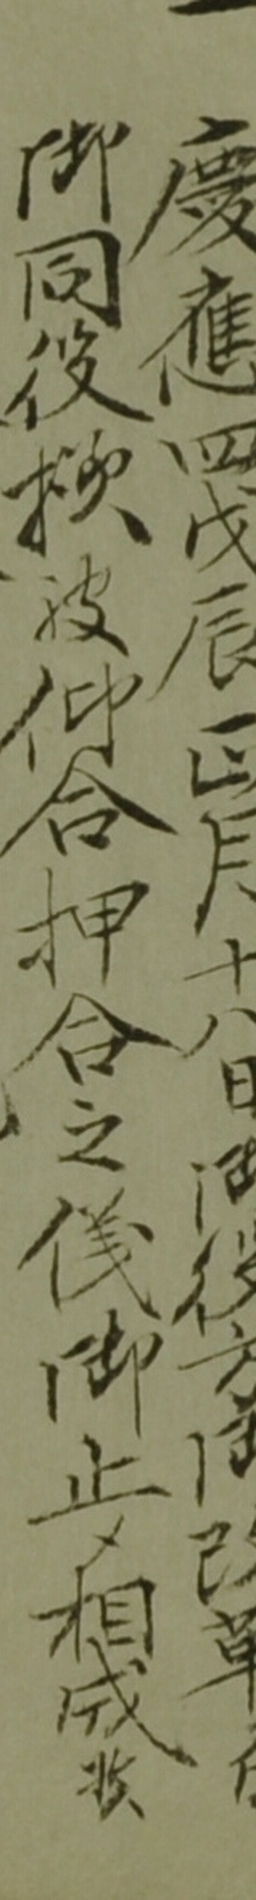御同役様被仰合押合之儀御止メ相成候
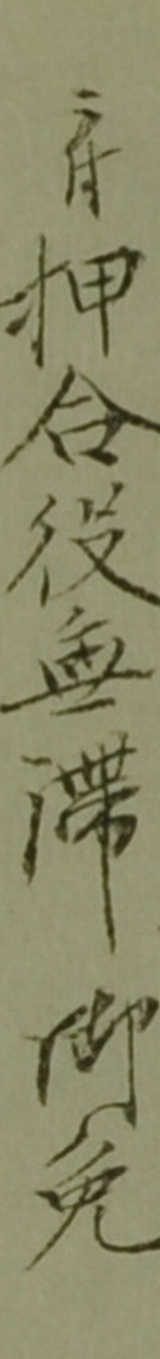ニ付押合役無滞御免

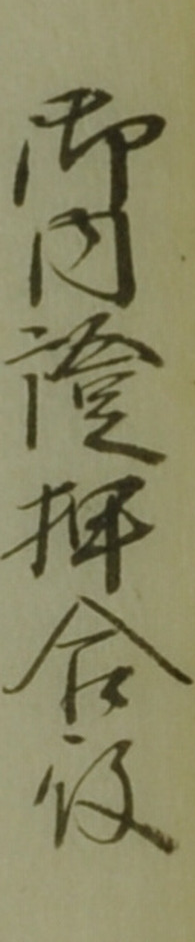御内証押合役
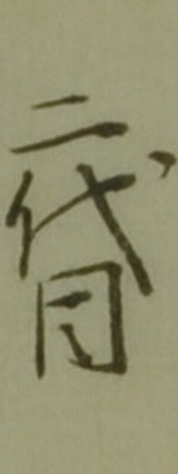二代目
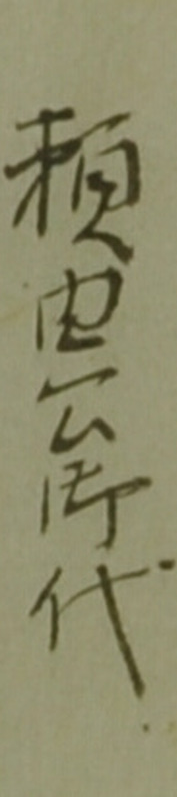頼由公御代
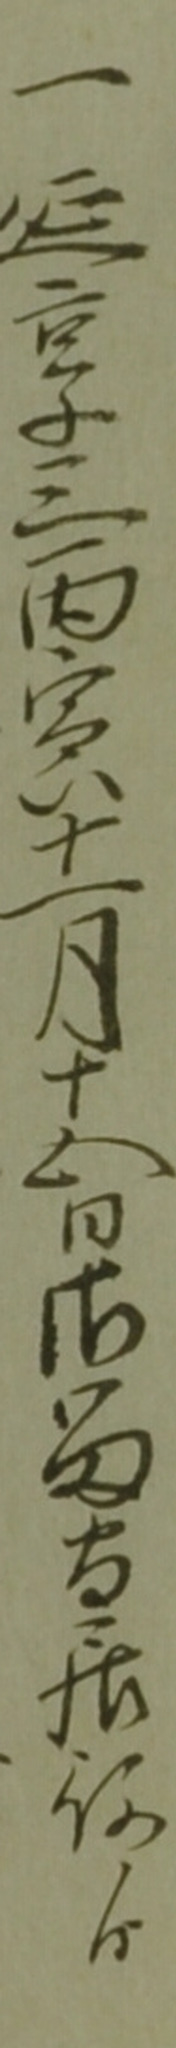一延享三丙寅十一月十五日御留守居役ゟ
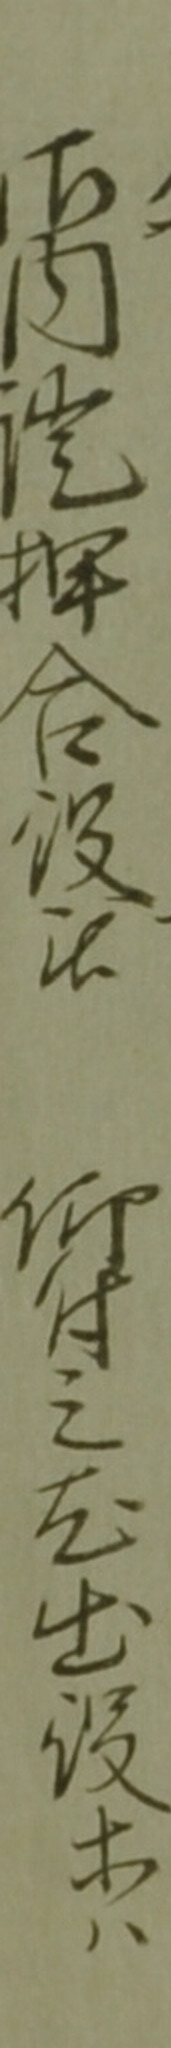御内証押合役被仰付之尤出役等ハ
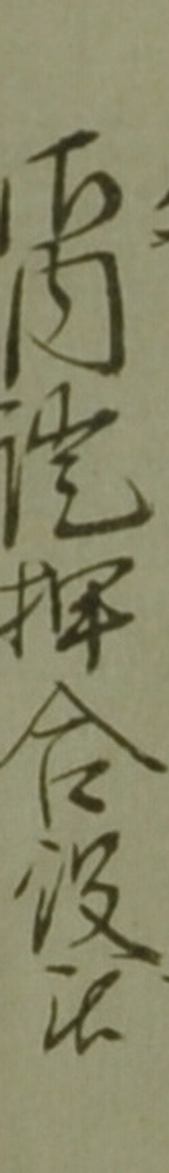御内証押合役
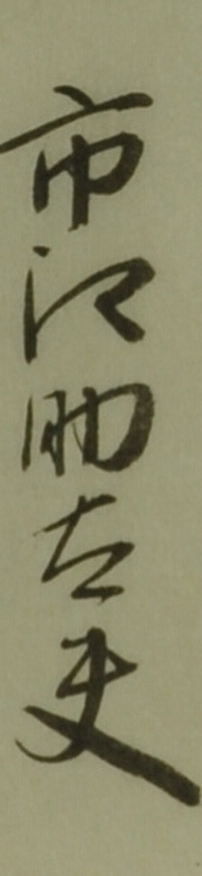市江助太夫
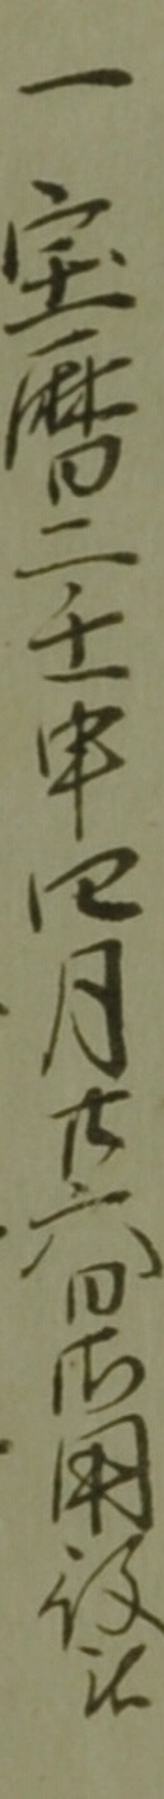一宝暦二壬申四月廿肋日御用役被
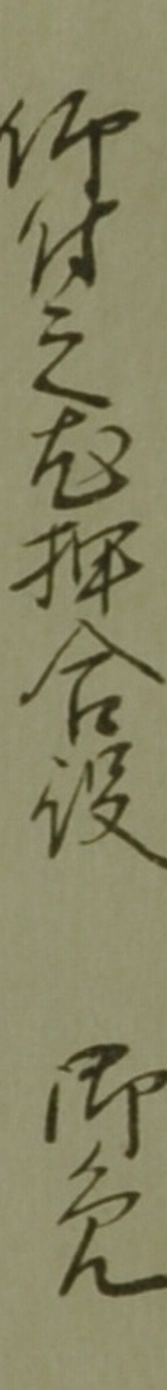仰付之尤押合役御免

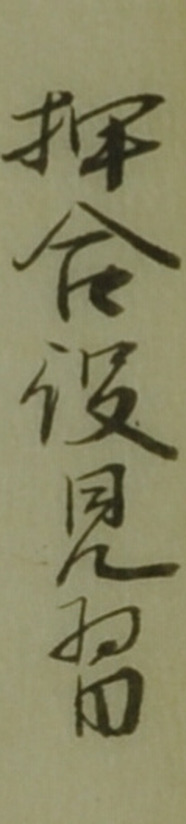押合役見習
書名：諸御役代々録（七）
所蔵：伊那市立高遠町図書館・合同会社AMANE
